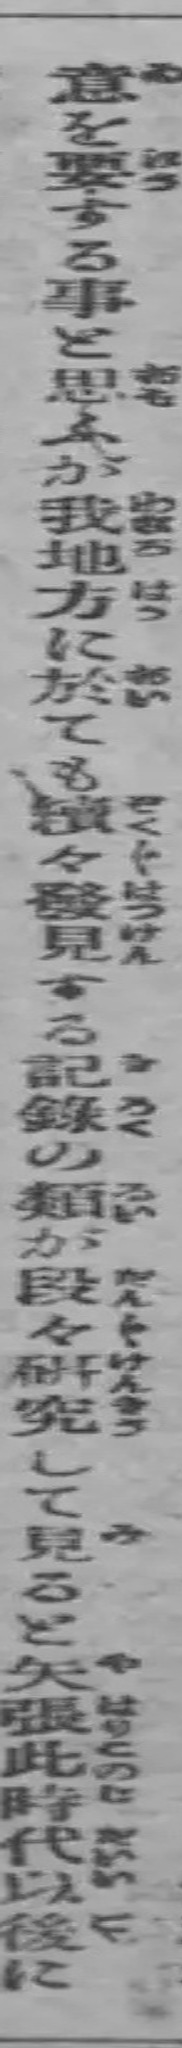意を要する事と思ふが我地方に於ても続々発見する記録の類が段々研究して見ると矢張此時代以後に
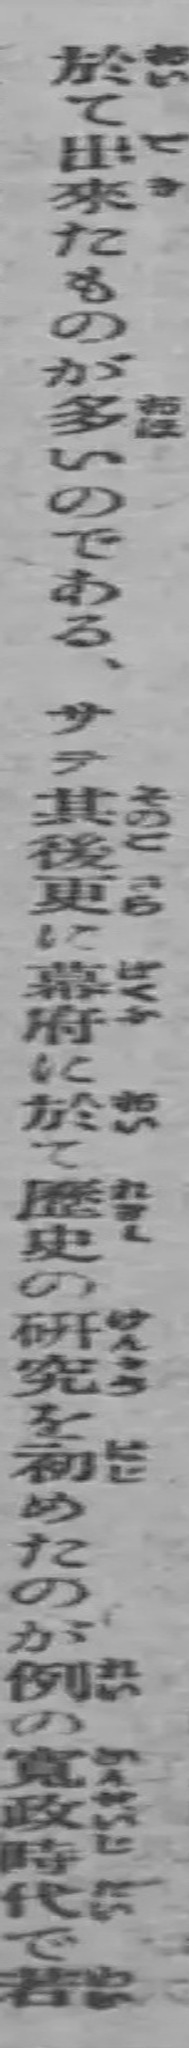於て出来たものが多いのである、サテ其後更に幕府に於て歴史の研究を初めたのが例の寛政時代で若
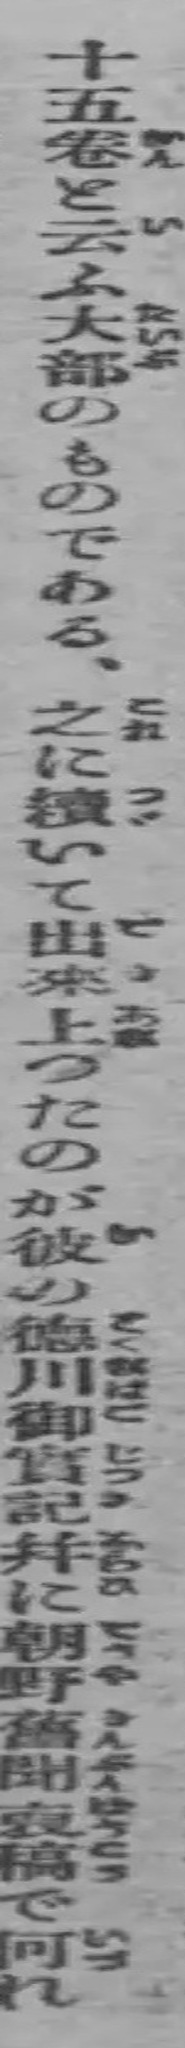十五巻と云ふ大部のものである、之に続いて出来上つたのが彼の徳川御実記幷に朝野旧聞裒稿で何れ
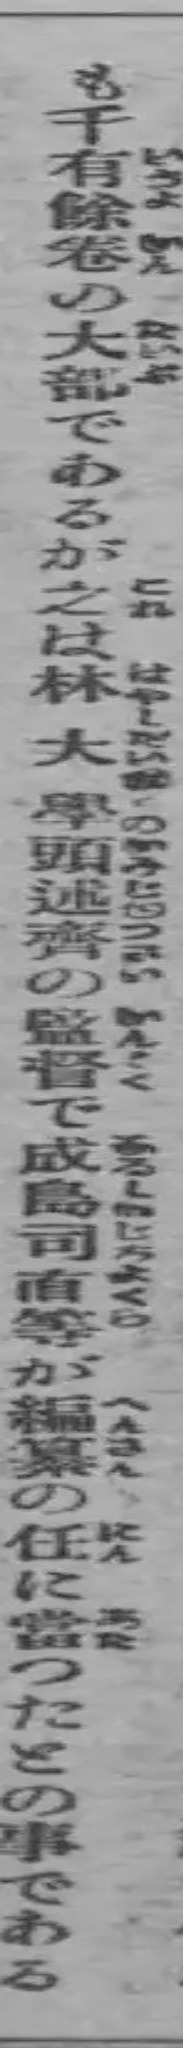も千有余巻の大部であるが之は林大学頭述斉の監督で成島司直等が編纂の任に当つたとのこ事である
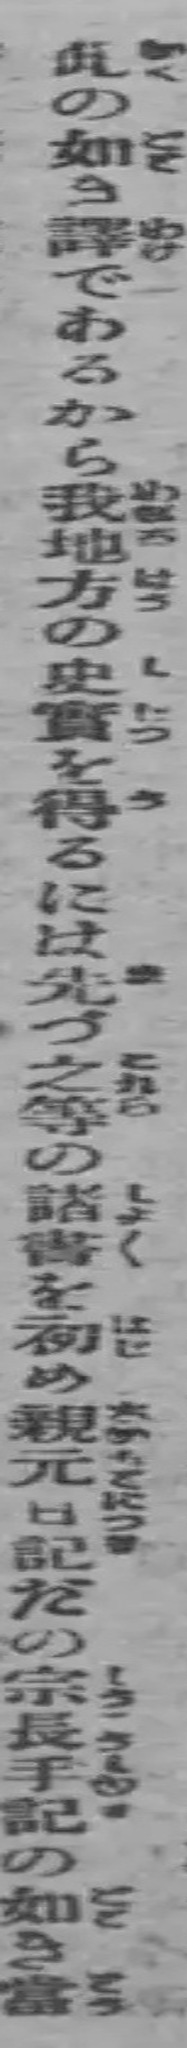此の如き訳であるから我地方の史実を得るには先づ之等の諸書を初め親元日記だの宗長手記の如き当
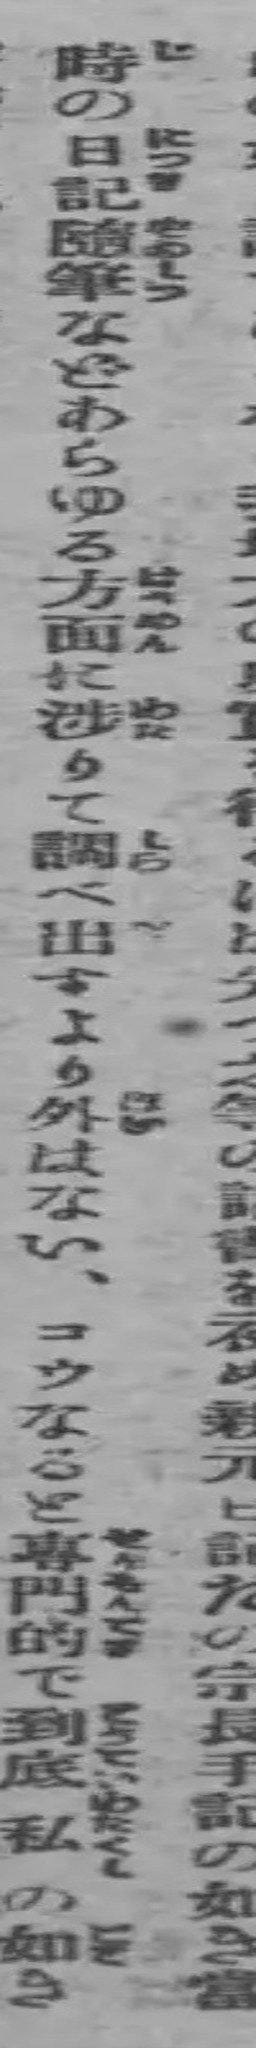時の日記随筆などあらゆる方面に渉りて調べ出すより外はない、コウなると専門的で到底私の如き
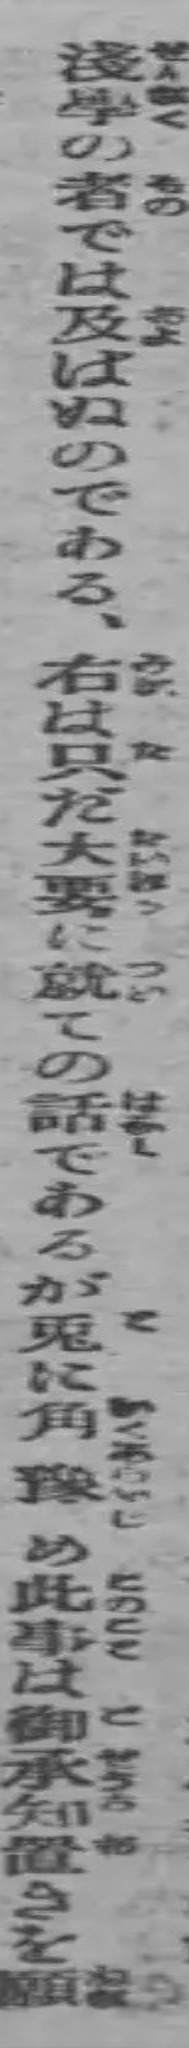浅学の者では及ばぬのである、右は只だ大要に就ての話であるが兎に角予め此事は御承知置きを願
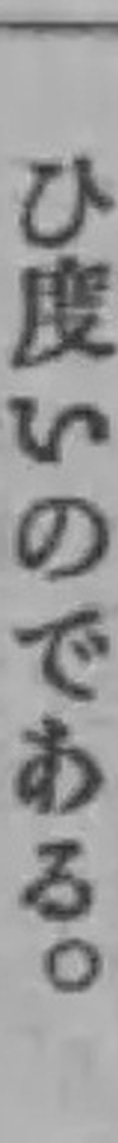ひ度いのである。
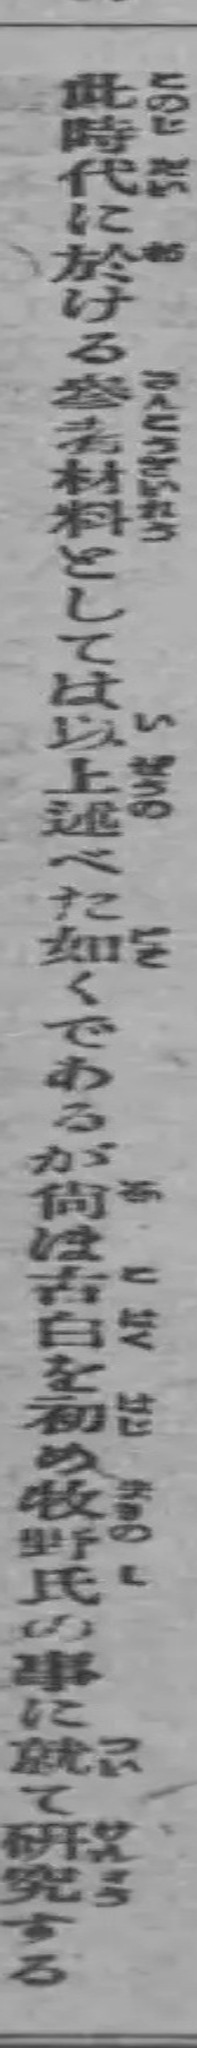古白の子孫此時代に於ける参考材料としては以上述べた如くであるが尚ほ古白を初め牧野氏の事に就て研究する
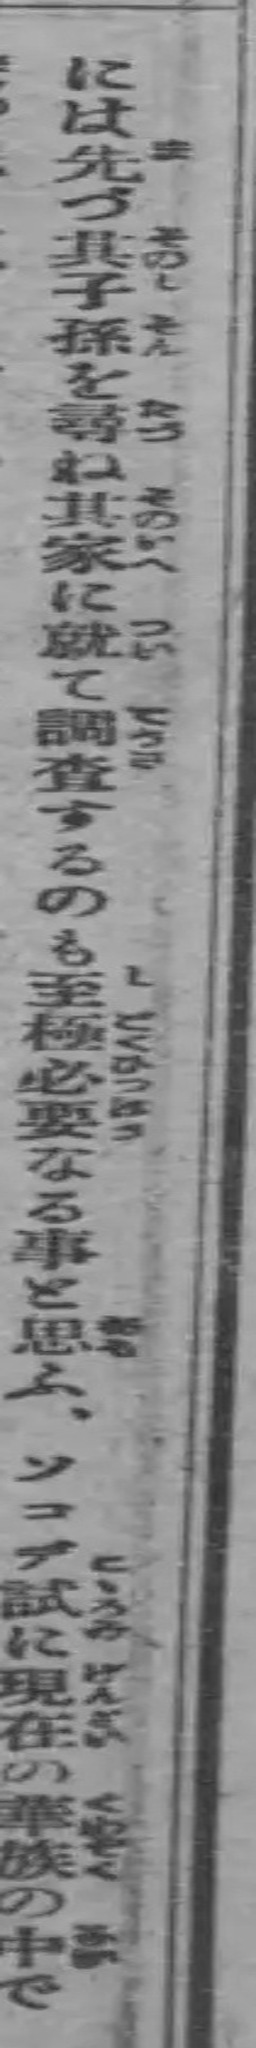には先づ其子孫を尋ね其家に就て調査するのも至極必要なる事と思ふ、ソコデ試に現在の華族の中で
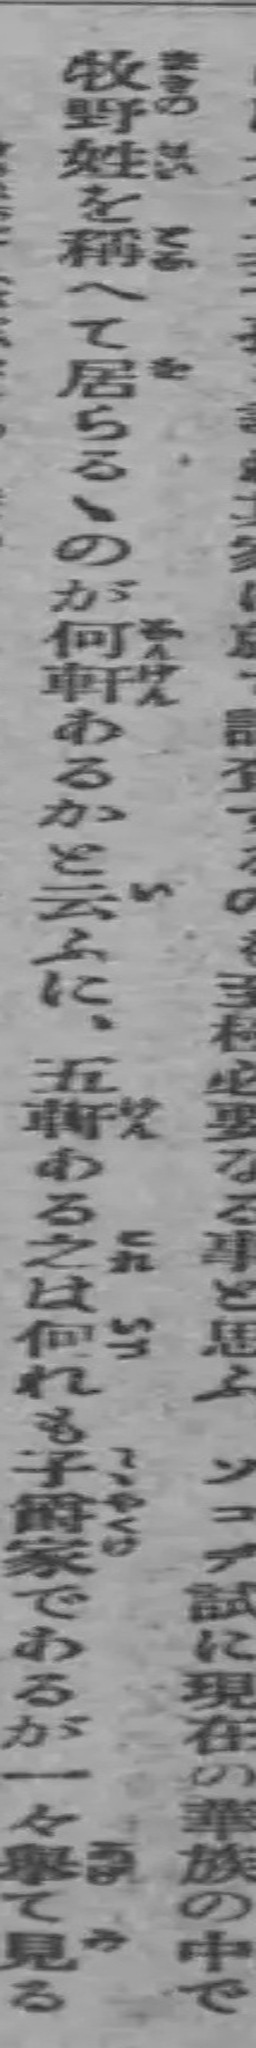牧野姓を称へて居らるゝのが何軒あるかと云ふに、五軒ある之は何れも子爵家であるが一々挙て見る
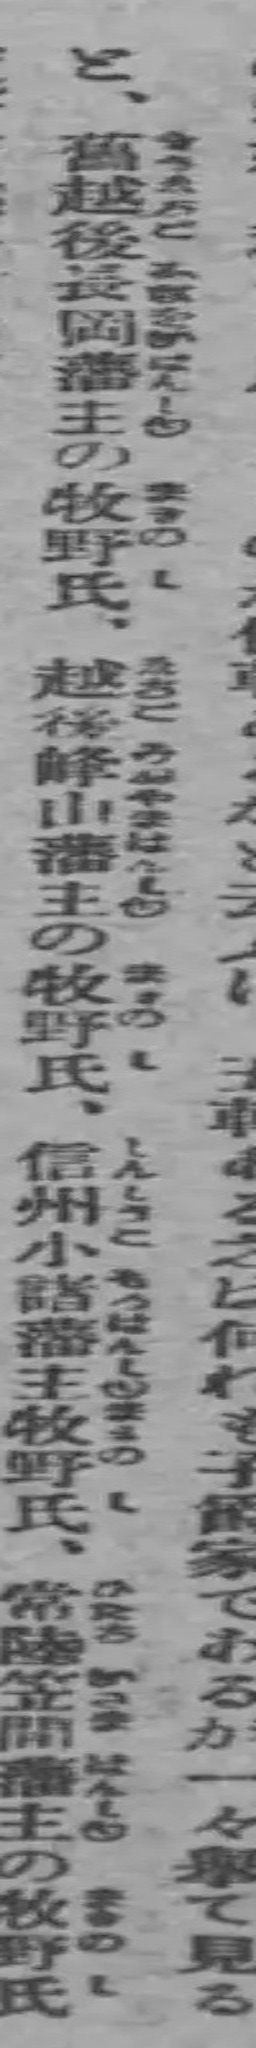と、旧越後長岡藩主の牧野氏、越後峰山藩主の牧野氏、信州小諸藩主牧野氏、常陸笠間藩主の牧野氏
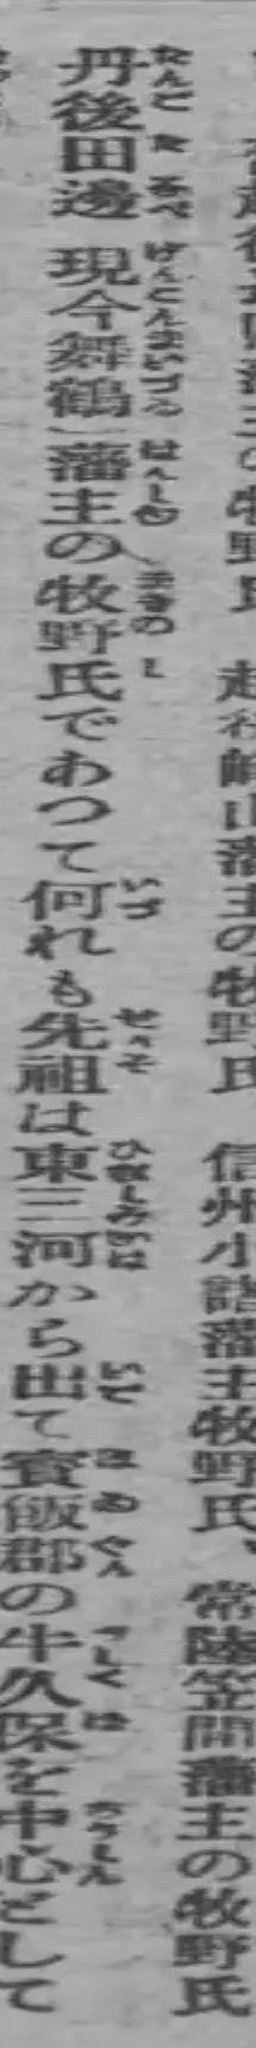牧野子爵家丹後田辺現今舞鶴藩主の牧野氏であつて何れも先祖は東三河から出て宝飯郡の牛久保を中心として
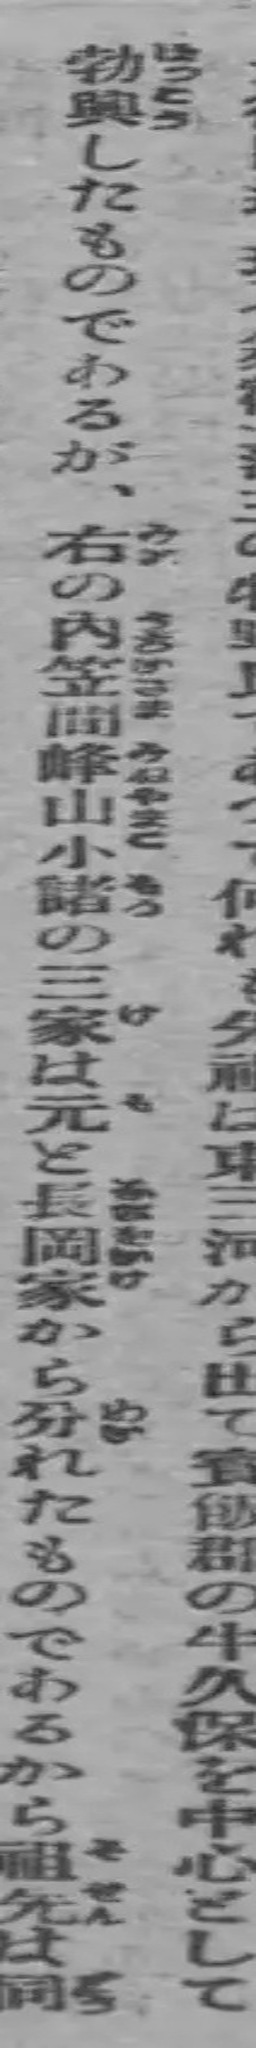勃興したものであるが、右の内笠間峰山小諸の三家は元と長岡家から分れたものであるから祖先は同
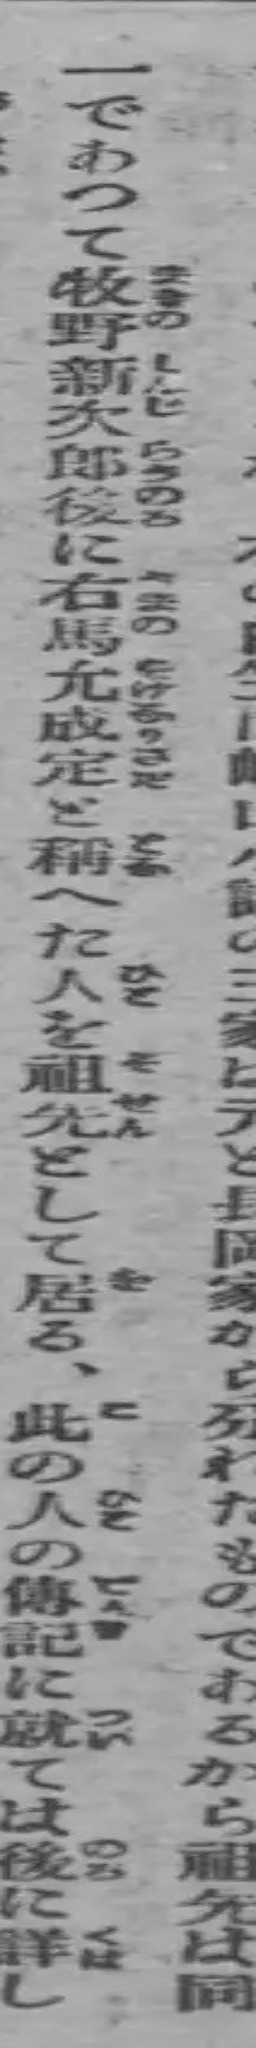一であつて牧野新次郎後に右馬允成定と称へた人を祖先として居る、此の人の伝記に就ては後に詳し
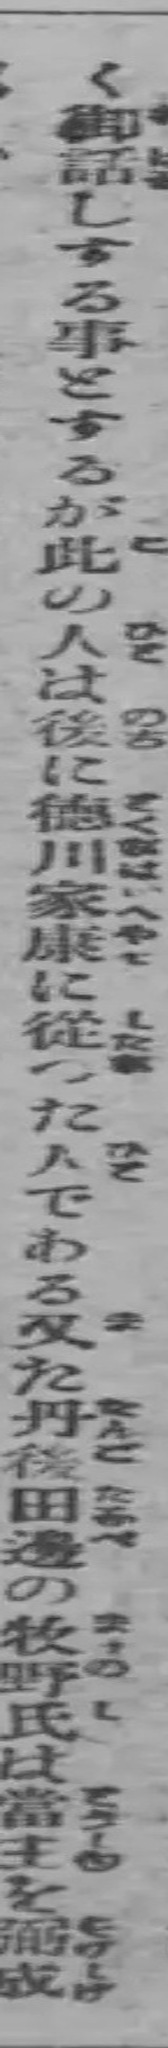く御話しする事とするが此の人は後に徳川家康に従つた人である又た丹後田辺の牧野氏は当主を弼成
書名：豊橋市史談
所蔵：国立国会図書館 National Diet Library, JAPAN
